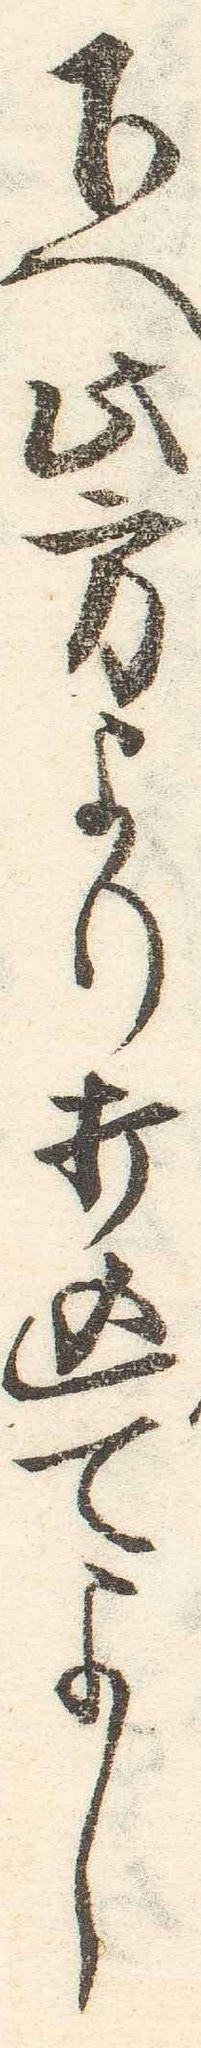下へ此方より打込てよし
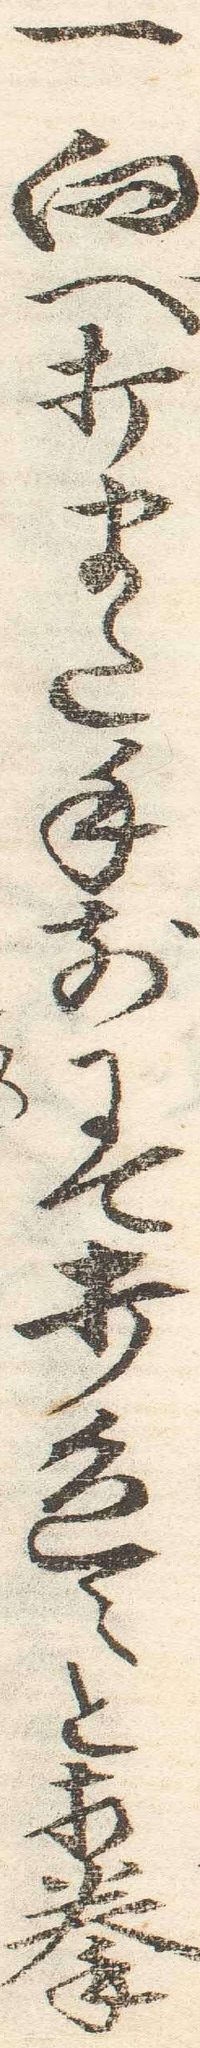一向へ打また手前にて打色々と打拳
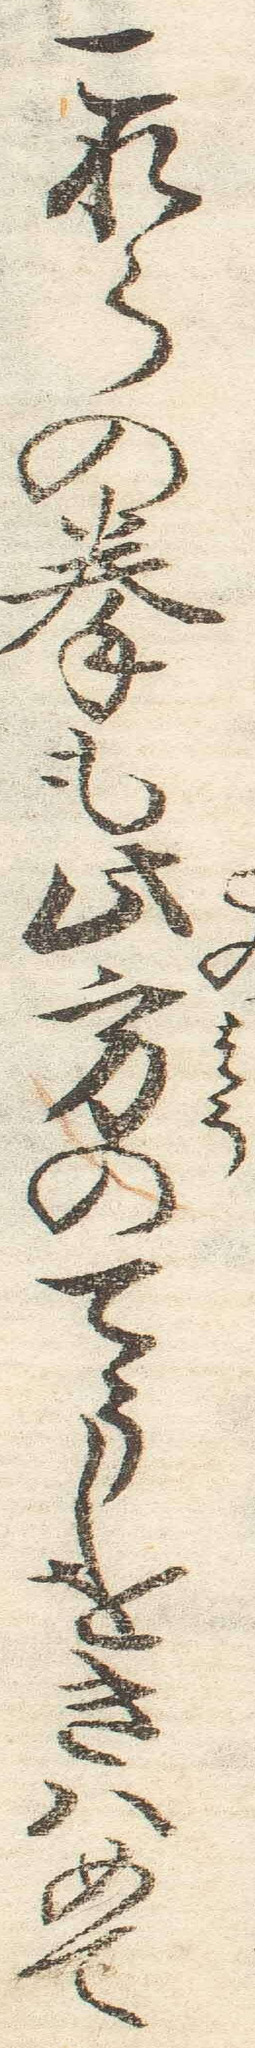これらの拳も此方のてうしをきはめて
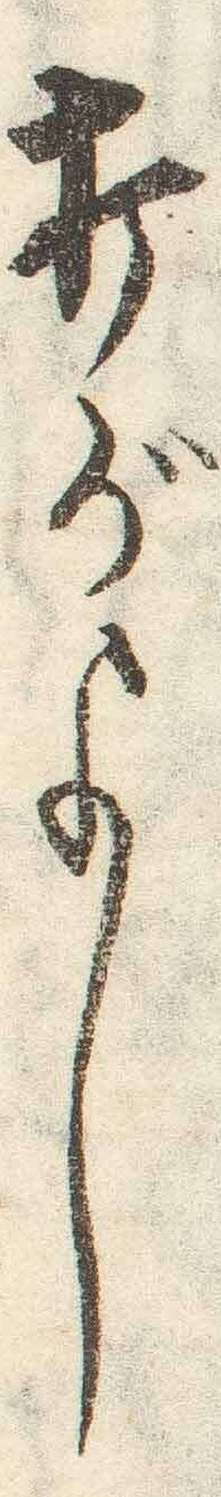打がよし

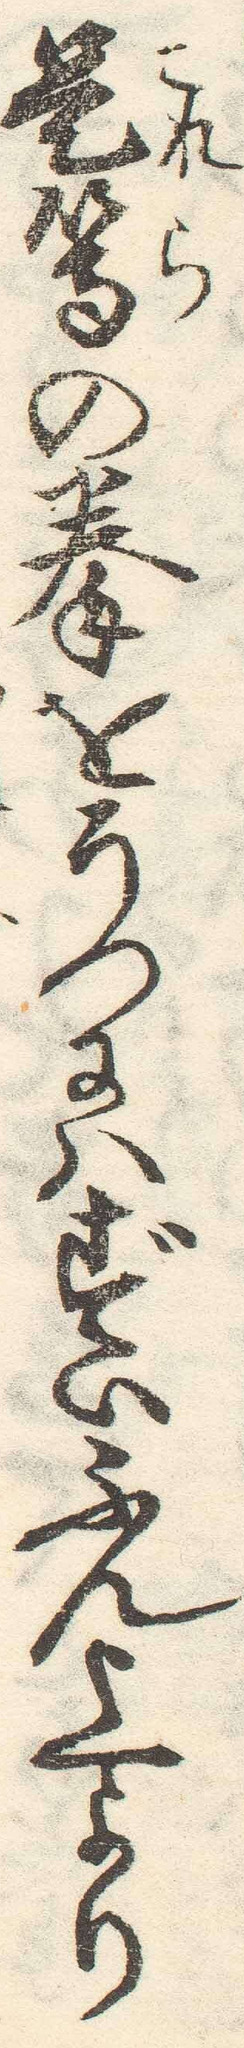是等の拳をうつにはずいふん上より
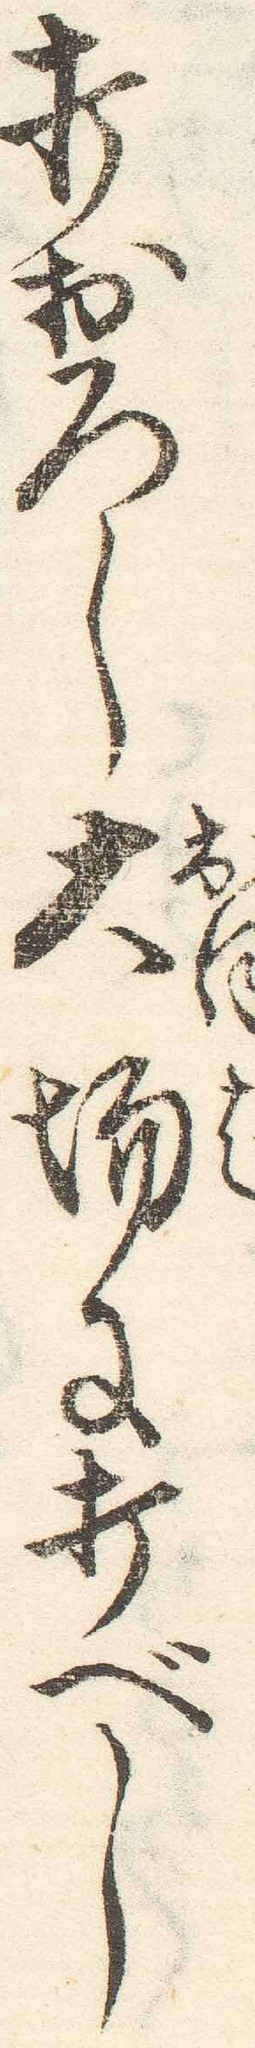打おろし大場に打べし
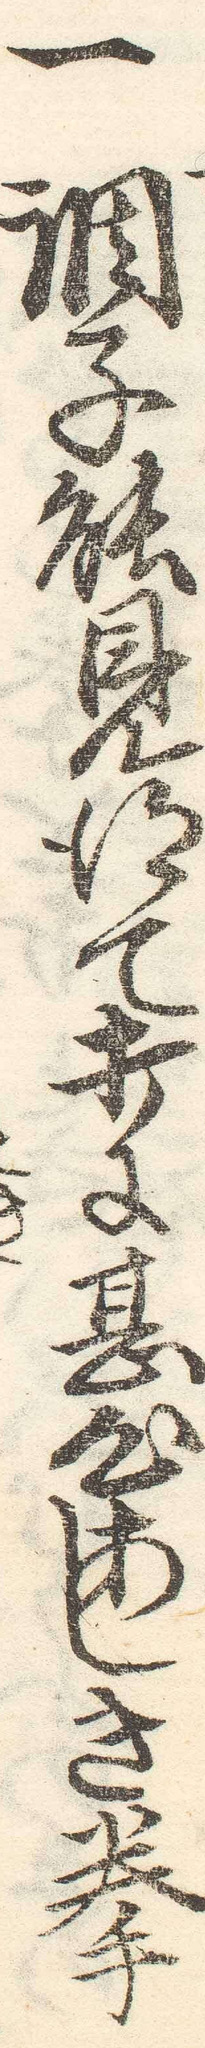一調子能見得て打に甚心あしき拳
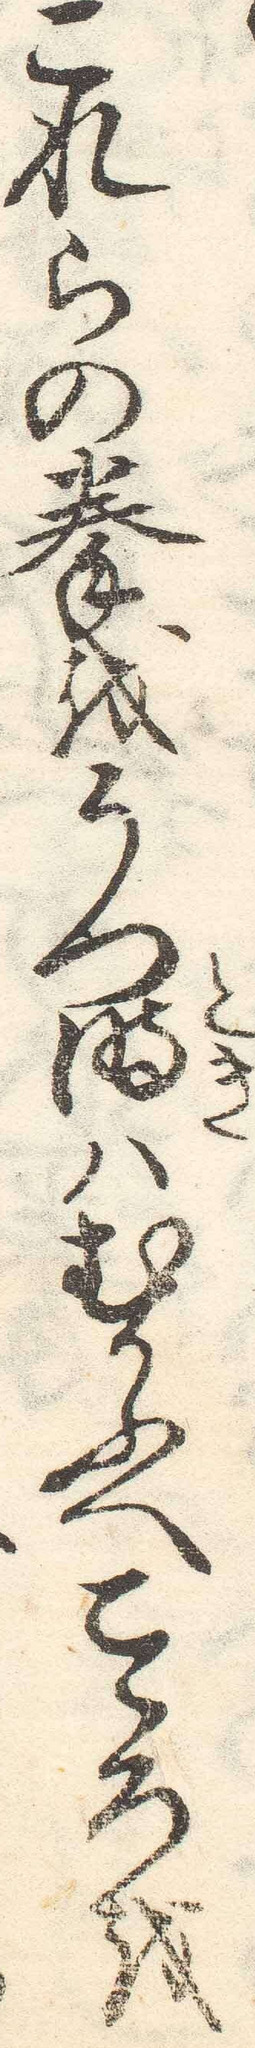これらの拳をうつ時はむかふへこゝろを
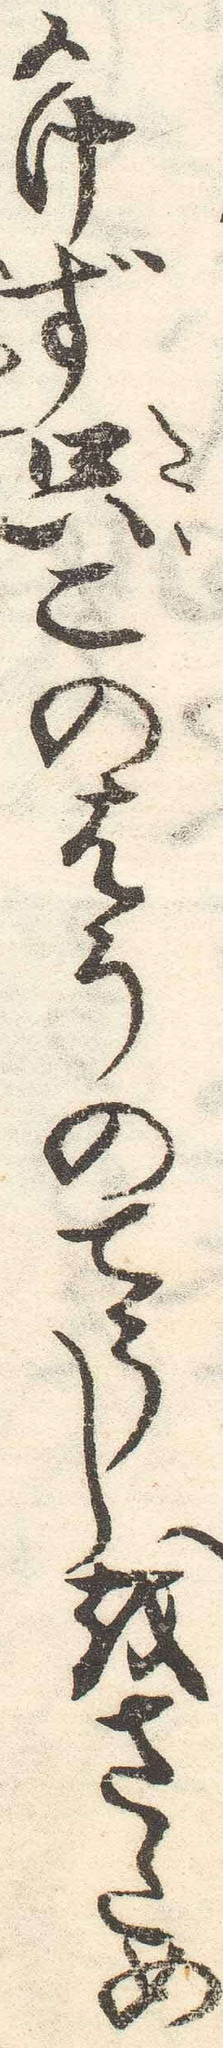かけず只このはうのてうしをさため
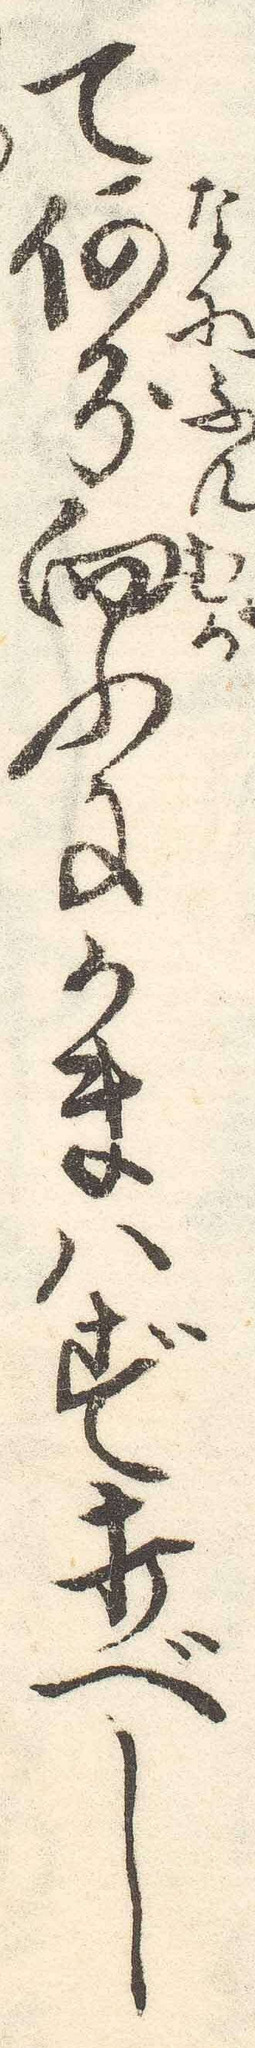て何分向ふにかまはず打べし
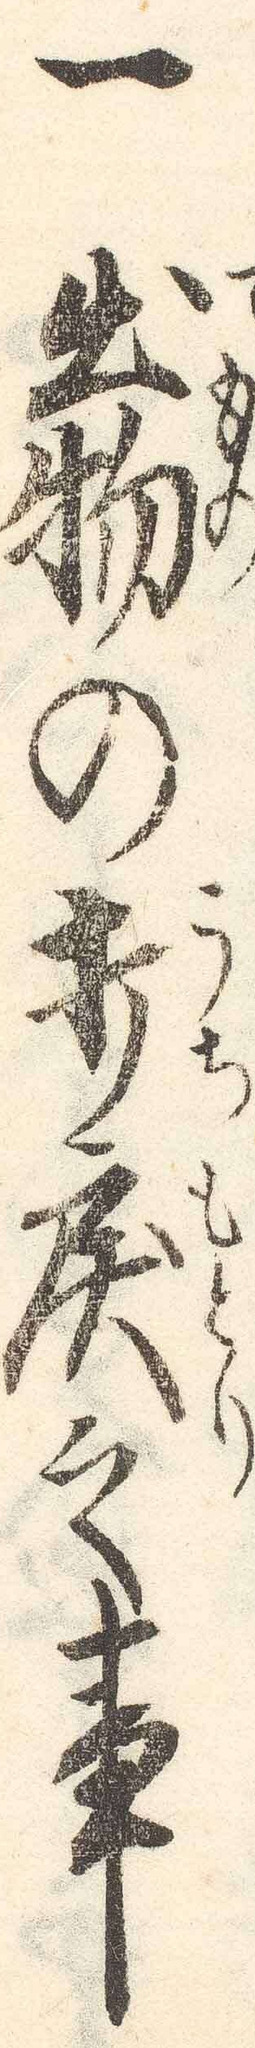一出物の打戻之事
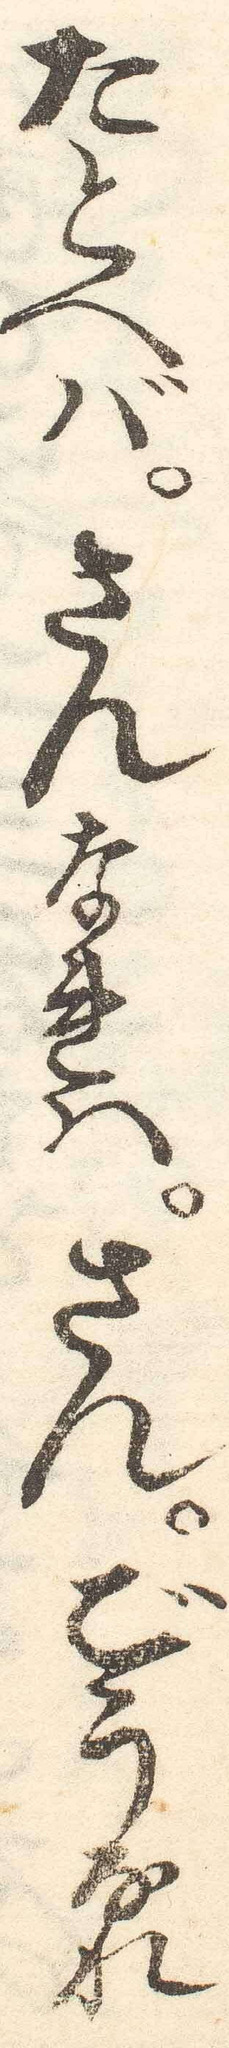たとへば。さんなれは。さん。ごうなれ
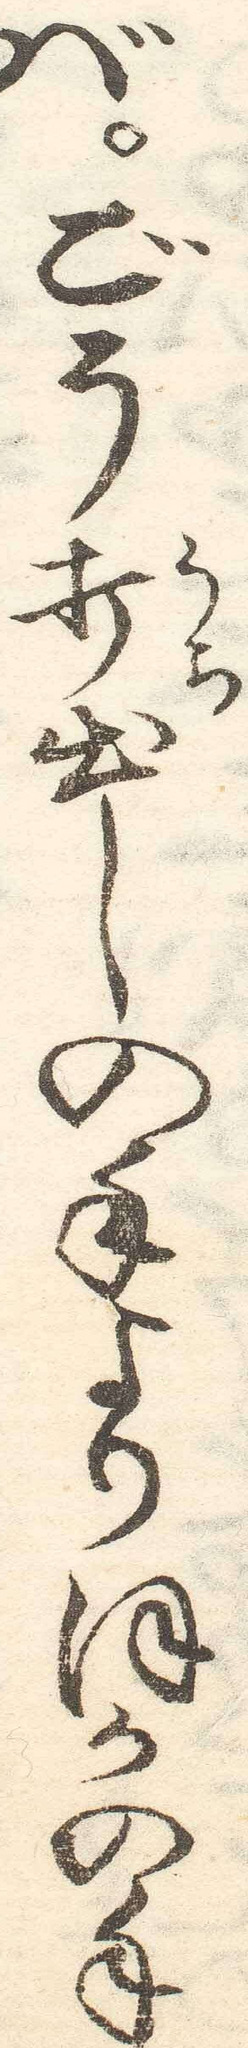ば。ごう打出しの手よりほかの手
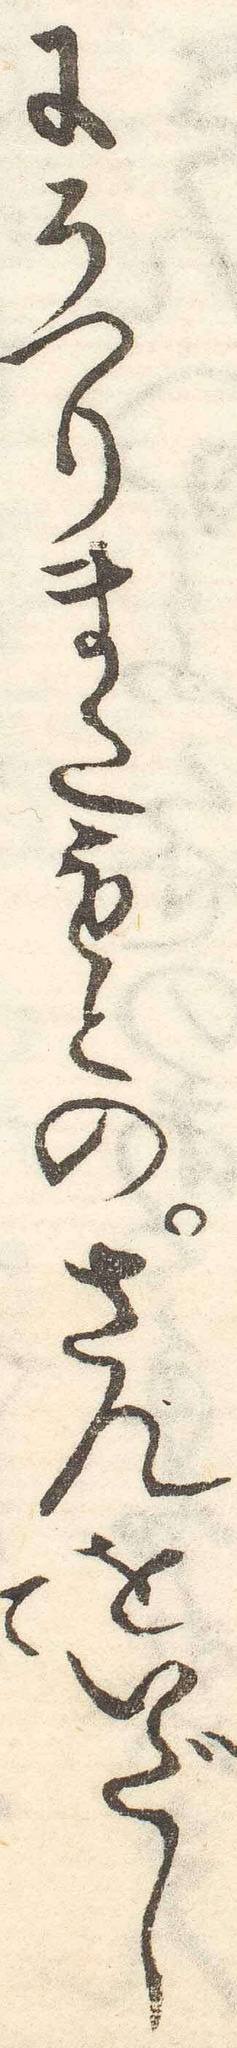にうつりまたもとの。さんをいだし
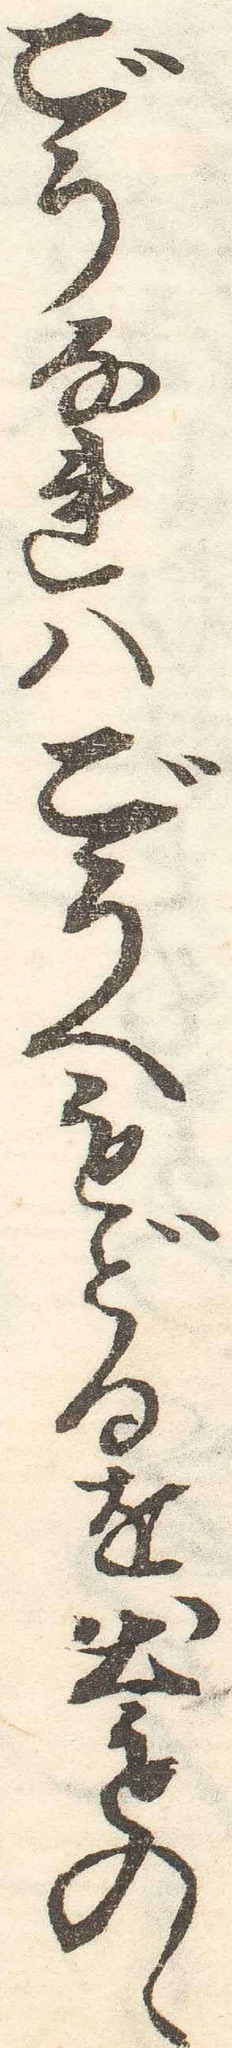ごうなれはごうへもどるを出ものゝ
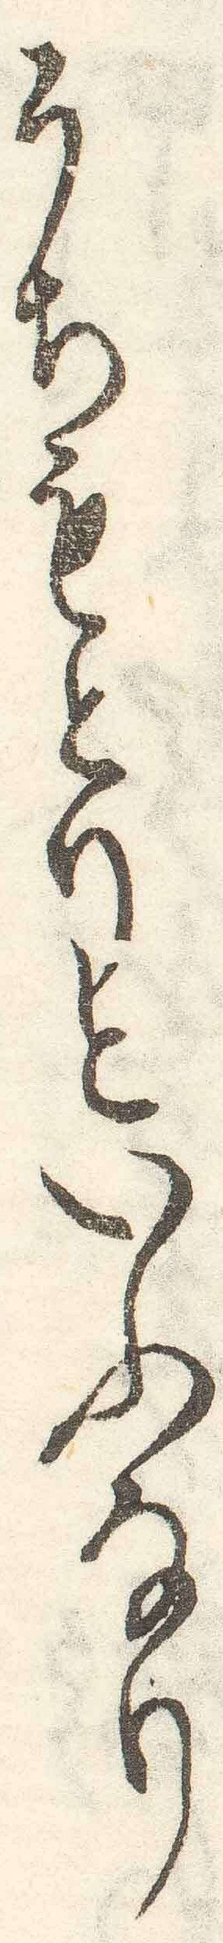うちもとりといふなり
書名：拳独稽古
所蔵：東京学芸大学附属図書館 国文学研究資料館
